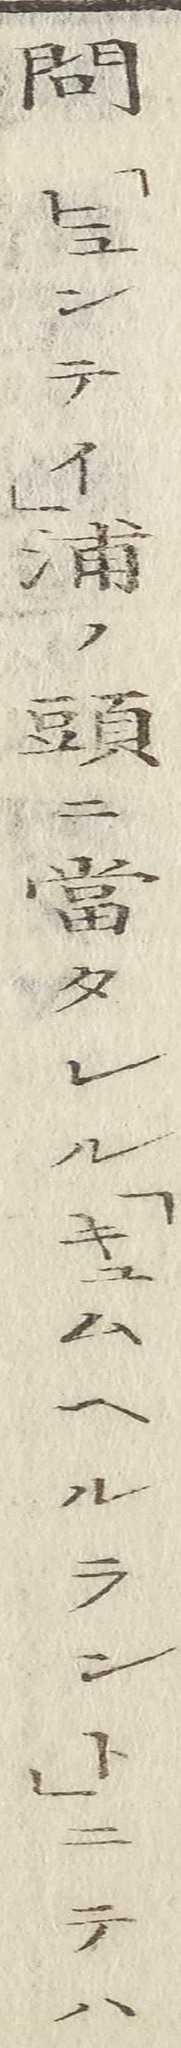問「ヒュンテイ」浦ノ頭ニ当タレル「キュムヘルラント」ニテハ
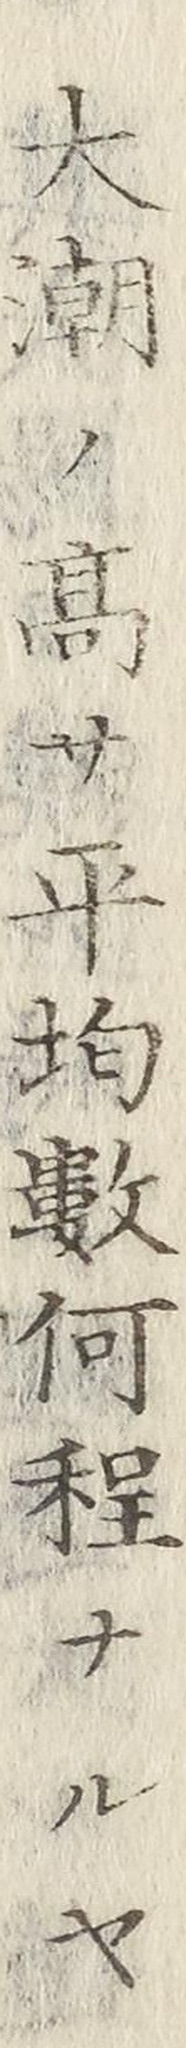大潮ノ高サ平均数何程ナルヤ
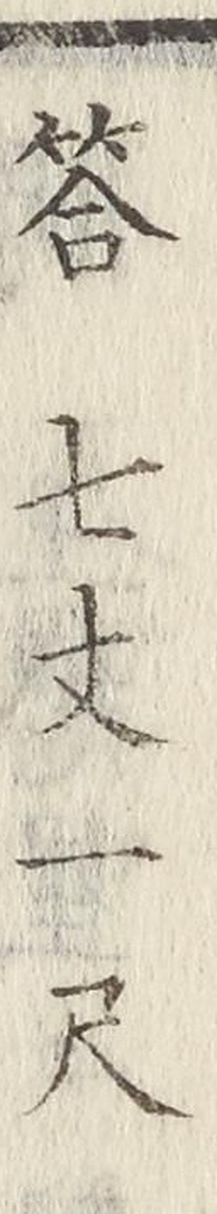答七丈一尺
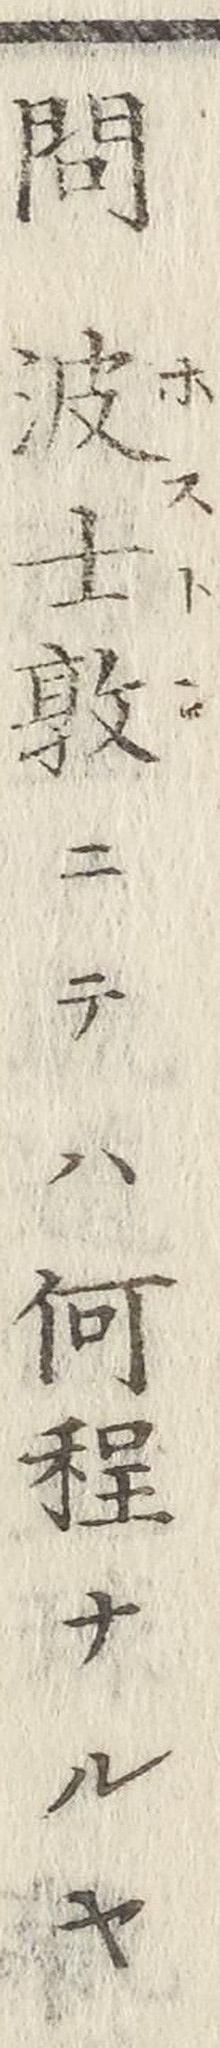問波士敦ニテハ何程ナルヤ
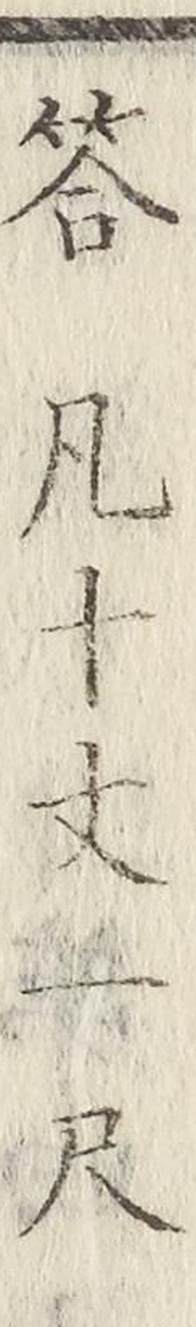答凡十丈一尺
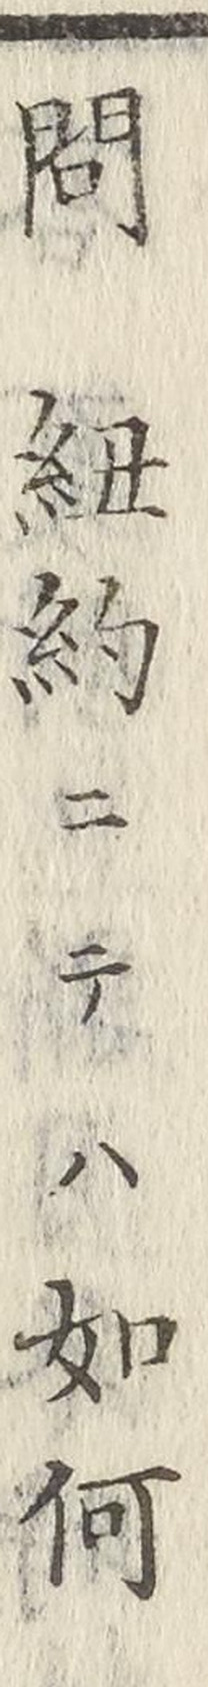問紐約ニテハ如何
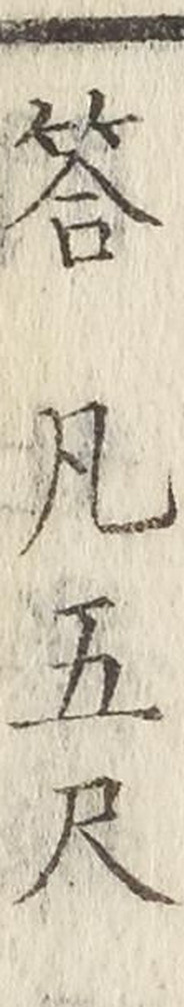答凡五尺
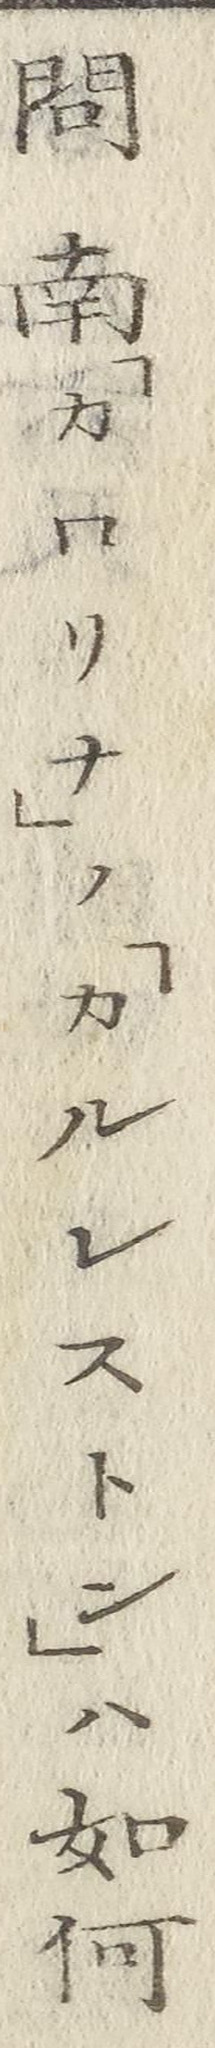問南「カロリナ」ノ「カルレストン」ハ如何

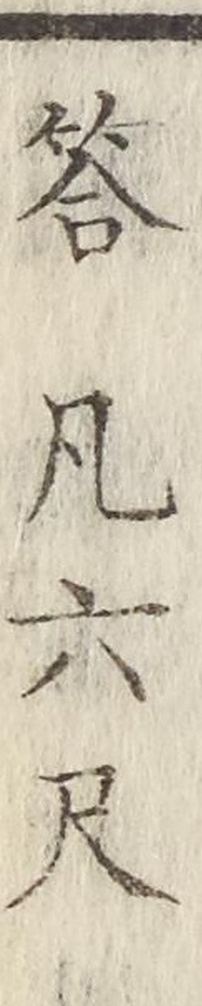答凡六尺
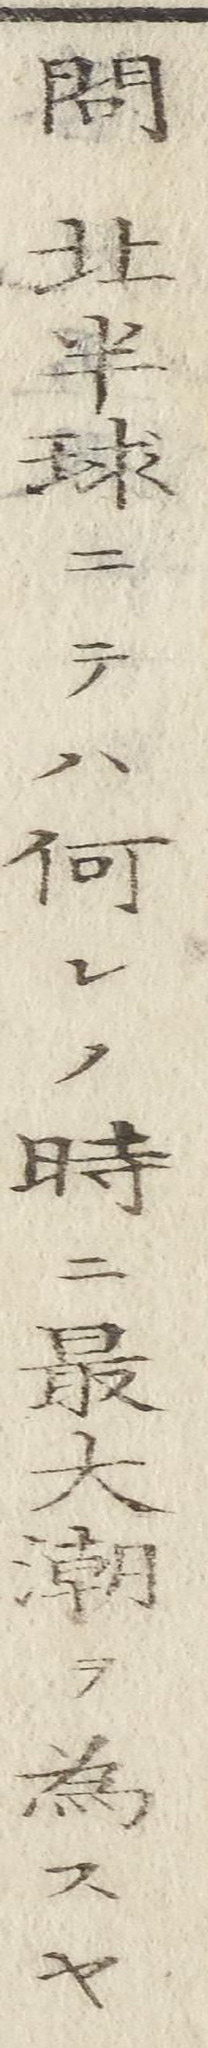問北半球ニテ何レノ時二最大潮ヲ為スヤ
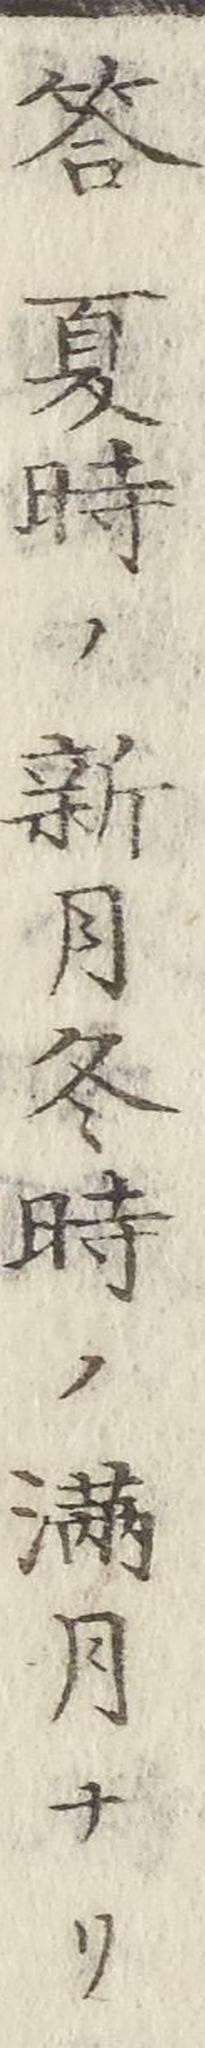答夏時ノ新月冬時ノ満月ナリ
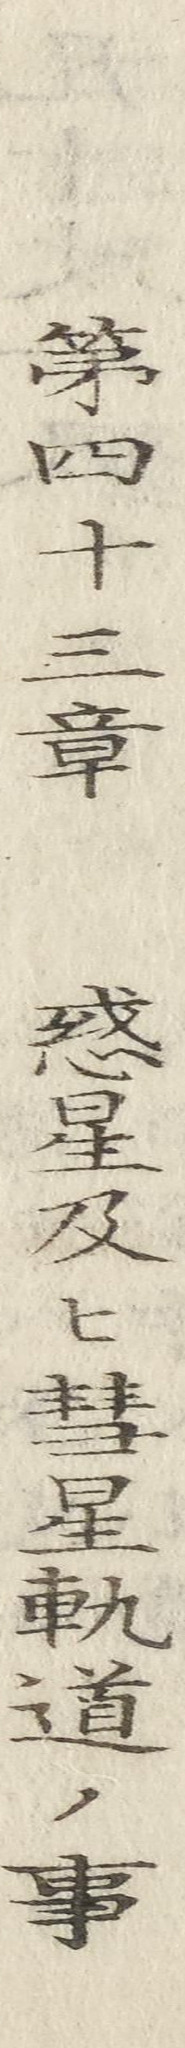第四十三章惑星及ヒ彗星軌道ノ事
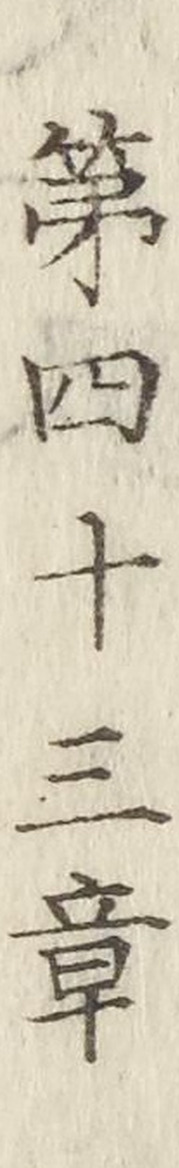第二十三図
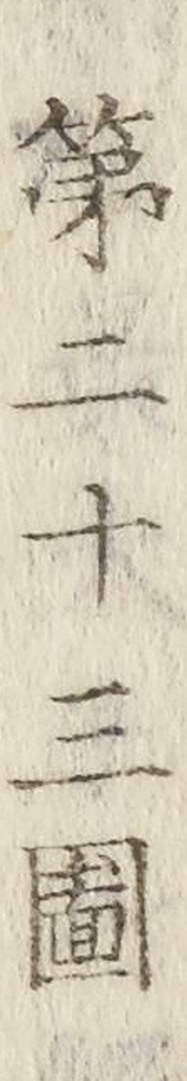第二十三図
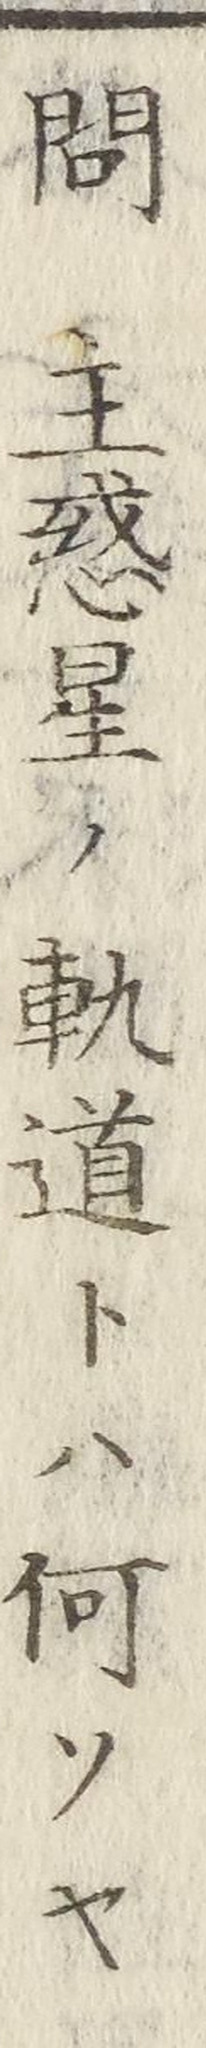問主惑星ノ軌道トハ何ソヤ
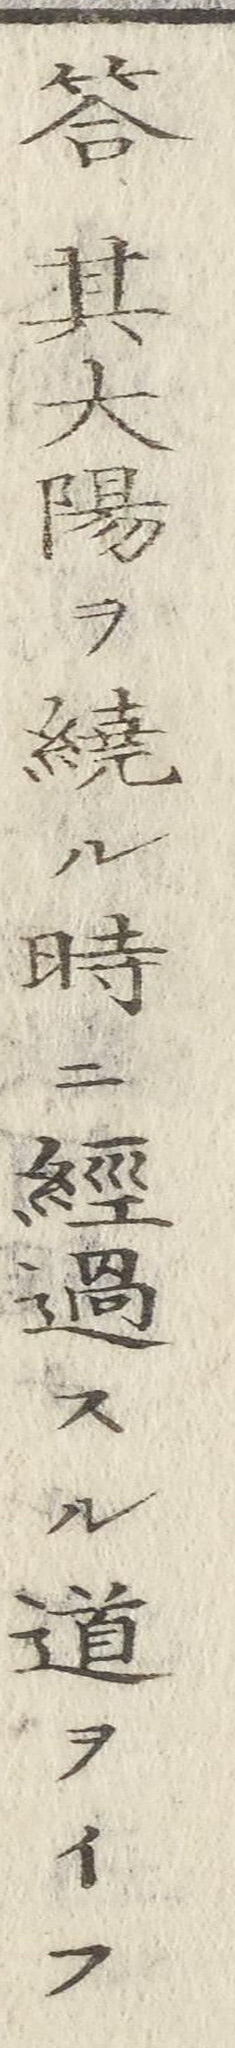答其太陽ヲ繞ル時ニ経過スル道ヲイフ
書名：星学圖説　下
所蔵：東京大学地震研究所図書室 Earthquake Research Institute Library, The University of Tokyo, JAPAN
